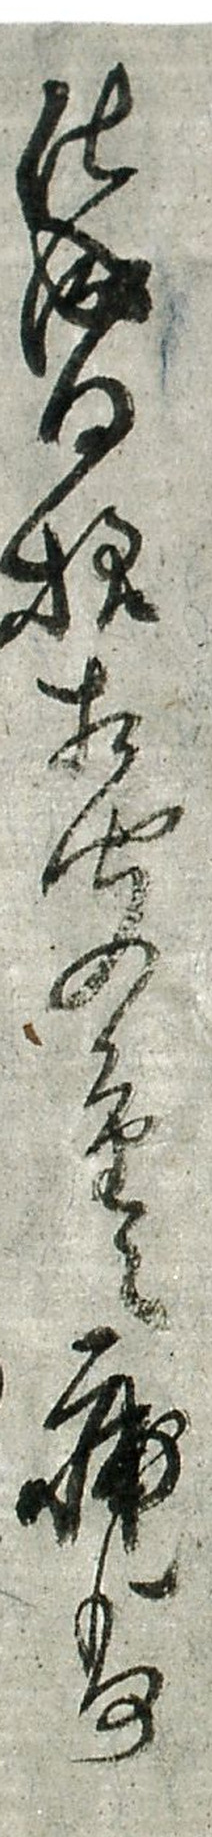仕成同様相聞重々痛布
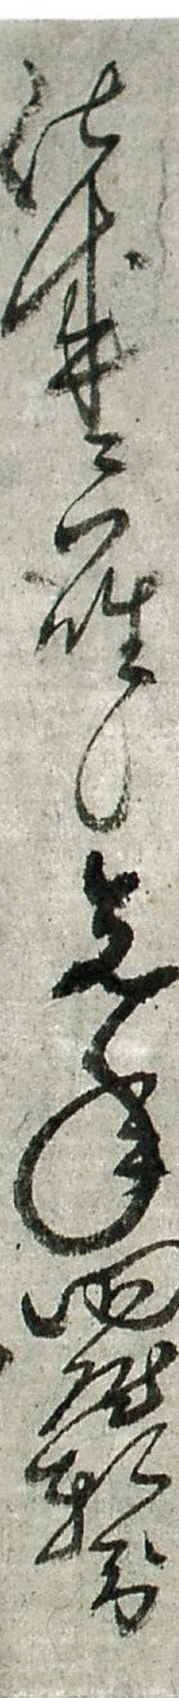仕成に御座候先年問屋軒別
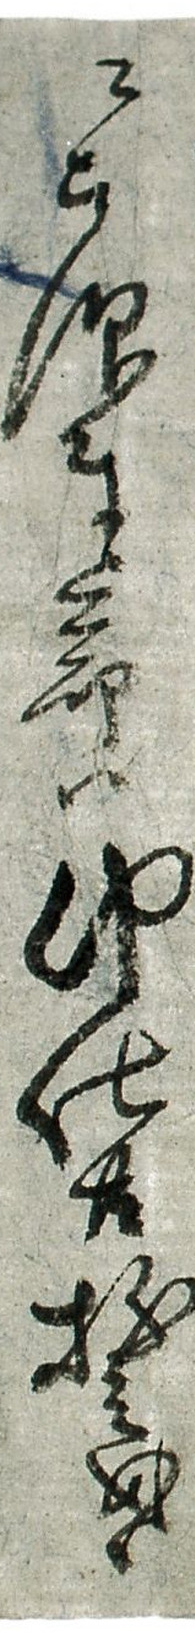に被仰付候節は仲仕共抔之義は
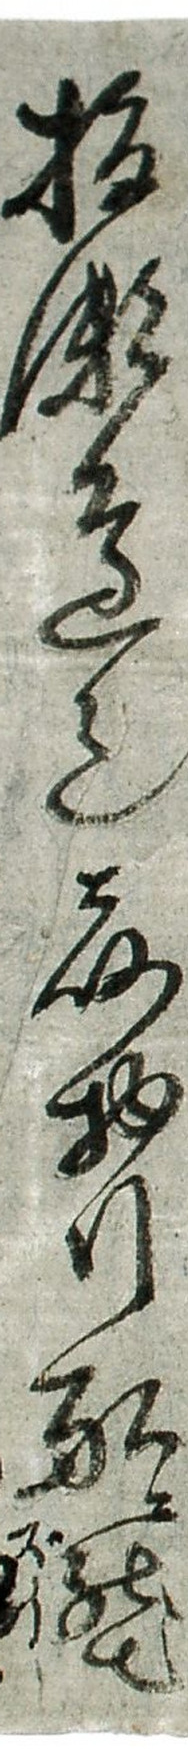指瀬辺迄荷物引船にのせ
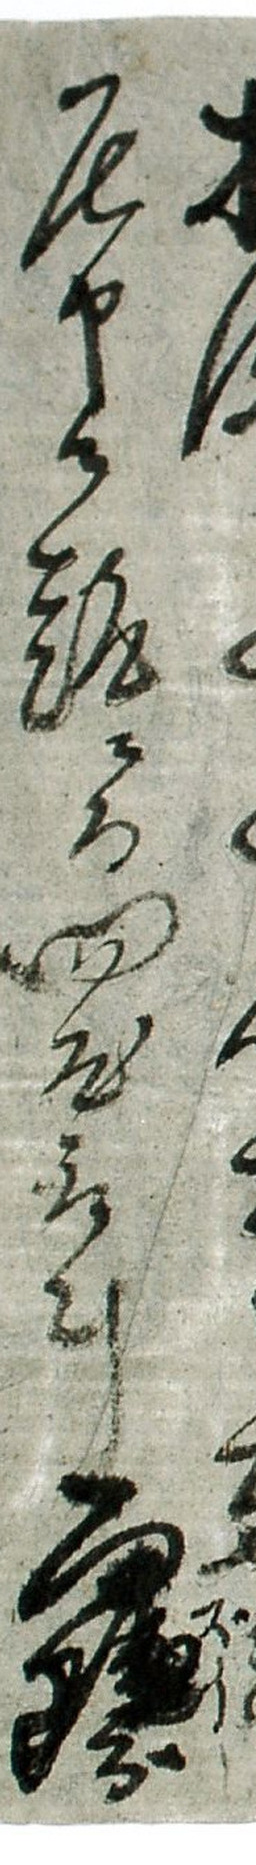居申候趣にて問屋取計向随分
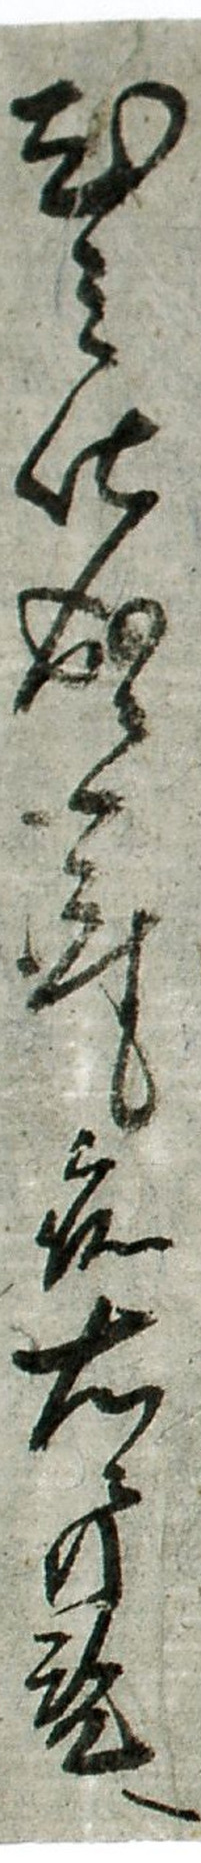尤之仕成に御座候所右に引替へ
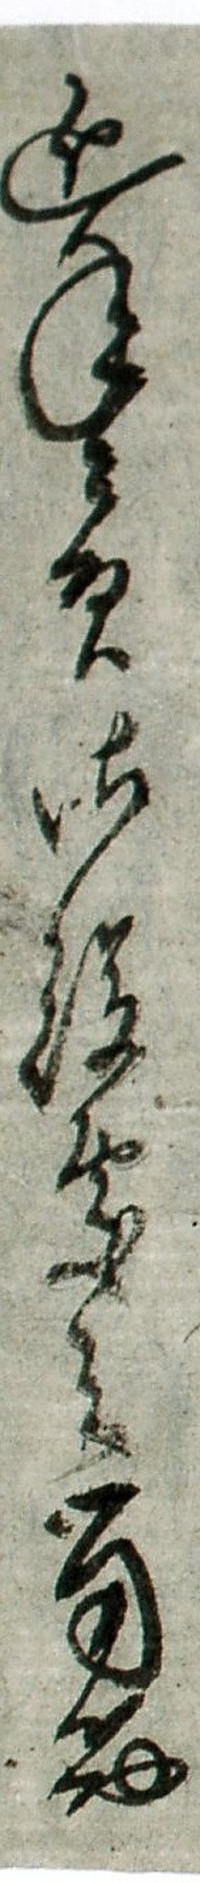近年にては御役処之御用筋
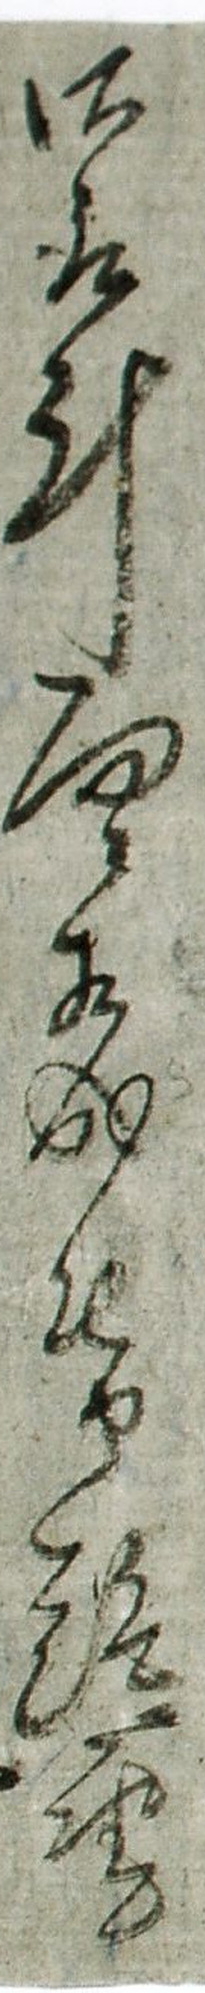御取計向に相成居申趣に御座候
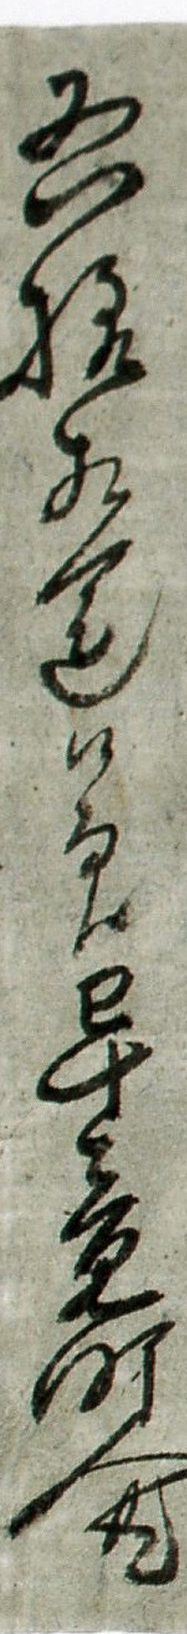右様相運候ては畢竟町人共
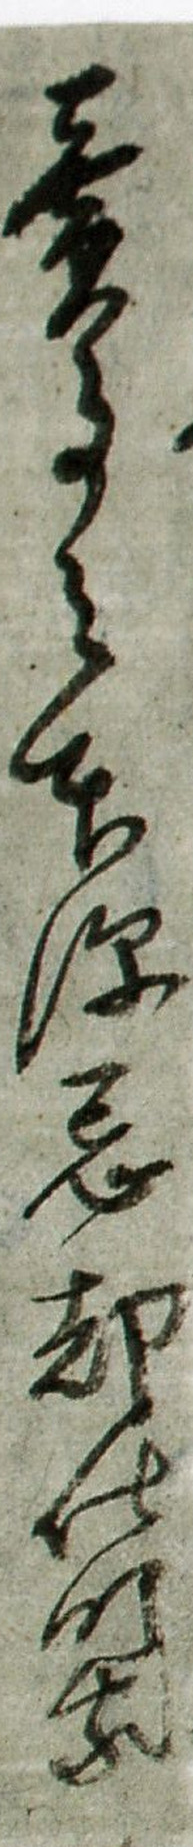売事之本源忌却仕町家
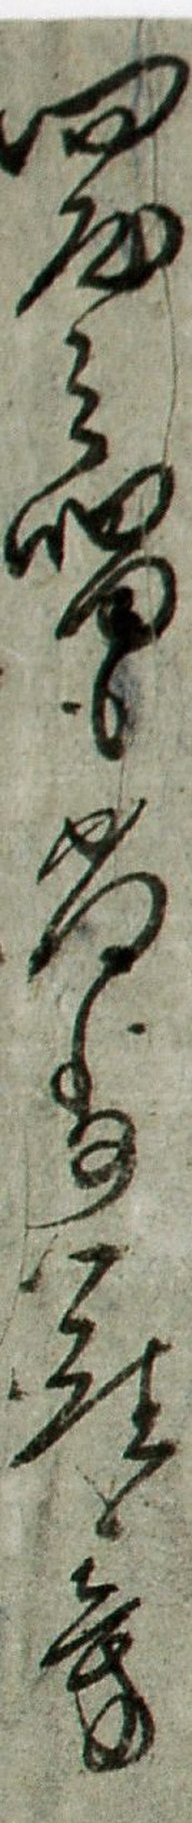問屋之唱も如何布御座候旁
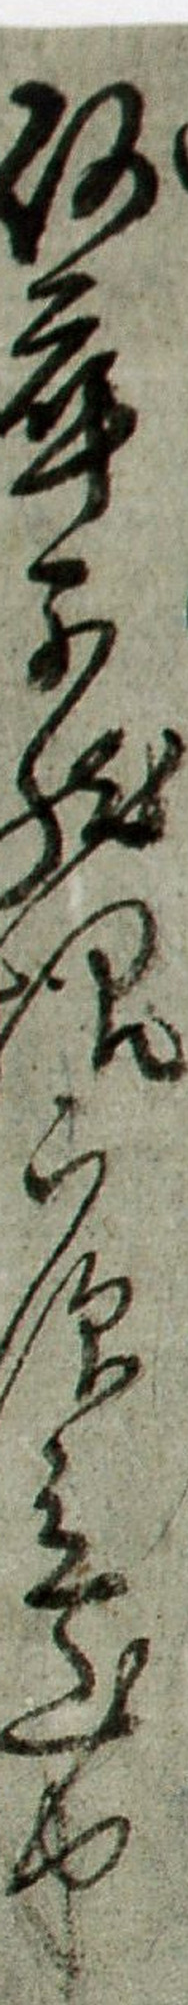何卒可然様被仰立山中

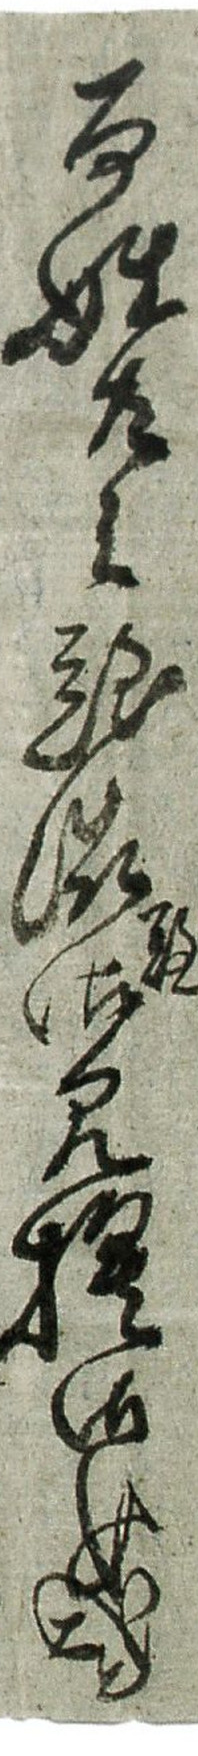百姓共之難渋難御見捨御義哉と
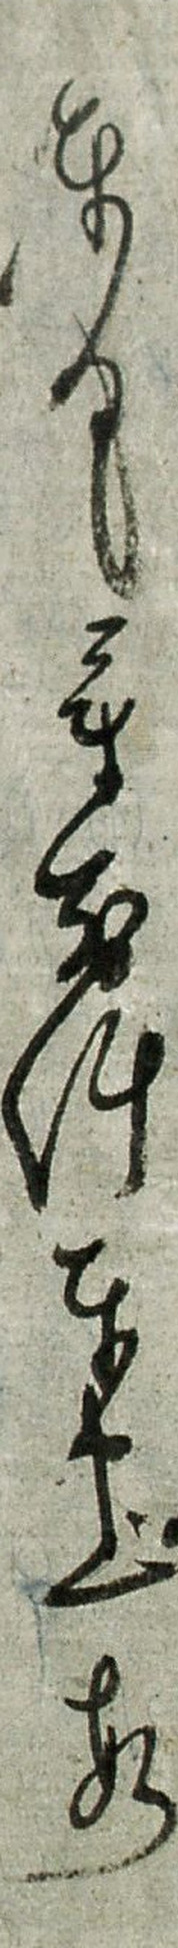奉存候に付前件奉申上段
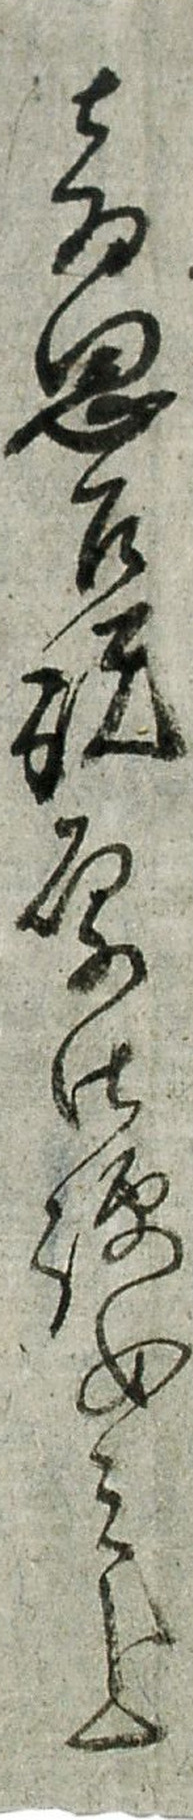被為思召既厚御評義之上
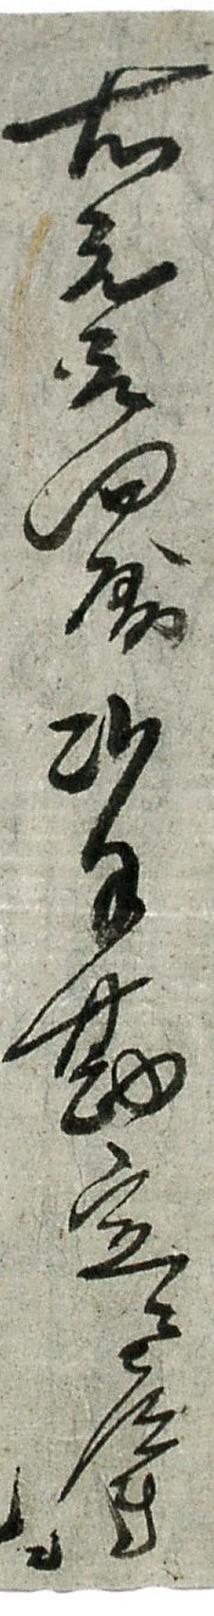右元取問屋弐手勘定に被仰付
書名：(美馬三好両郡百姓共煙草問屋壱手勘定ニ相成迷惑願右始末承申上書付之写）
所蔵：鳴門教育大学 Naruto University of Education
